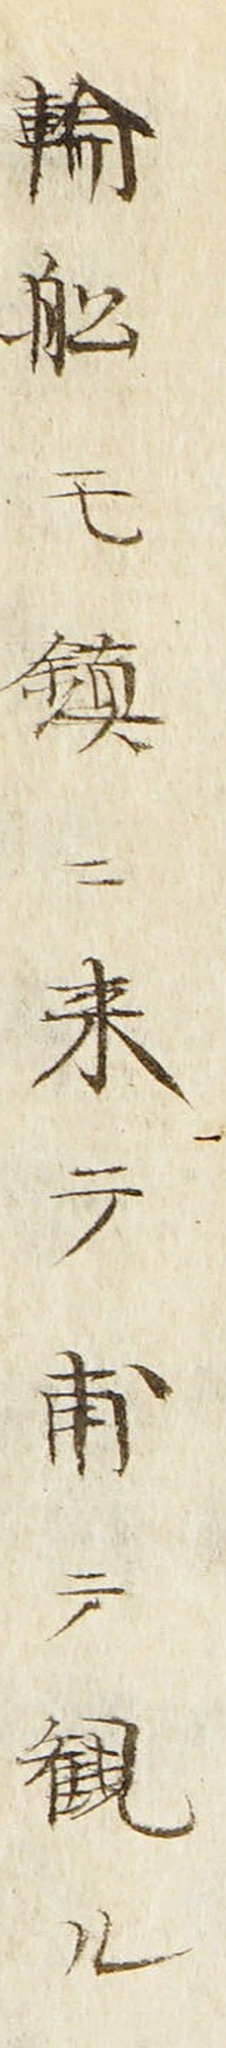輪舩モ鎮ニ来テ甫テ観ル

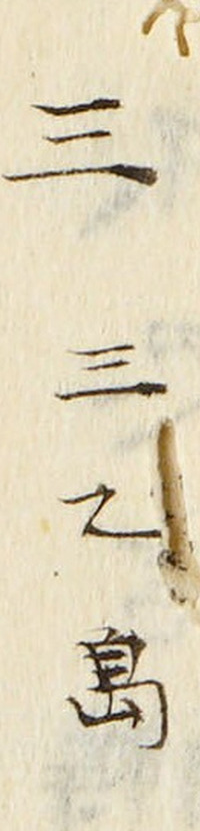三三乙島
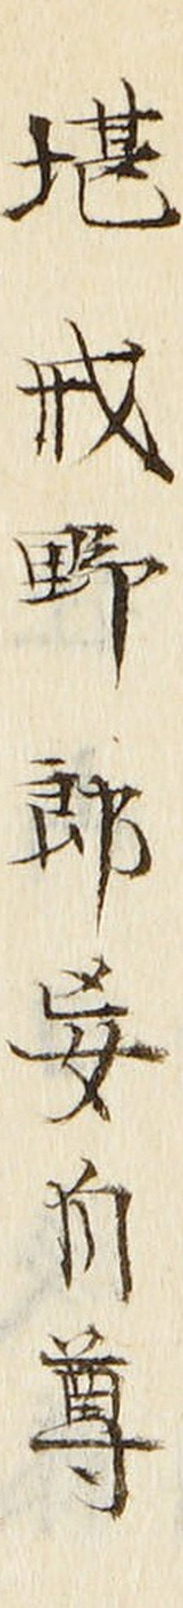堪戒野郎妄自尊
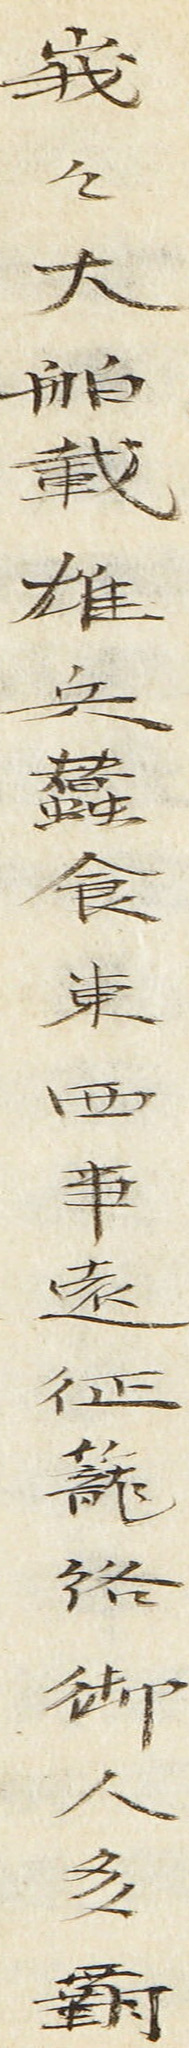峨々大舶載雄兵蠺食東西事遠征籠絡御人多覇

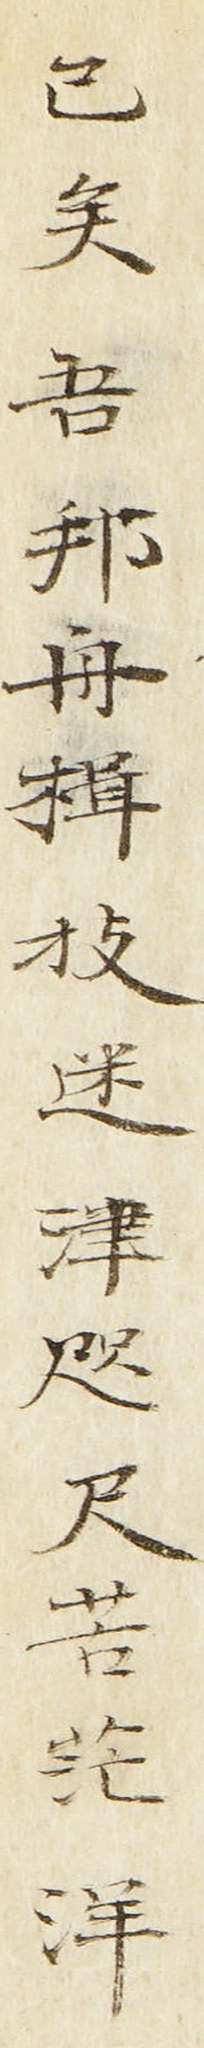已矣吾邦舟楫技迷津咫尺苦茫洋

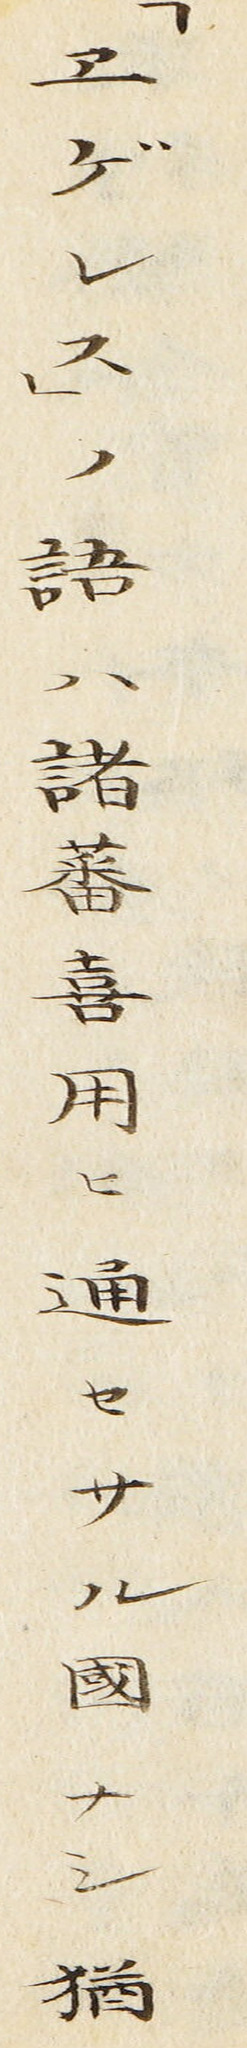〇「ヱゲレス」ノ語ハ諸蕃喜用ヒ通セサル國ナシ猶
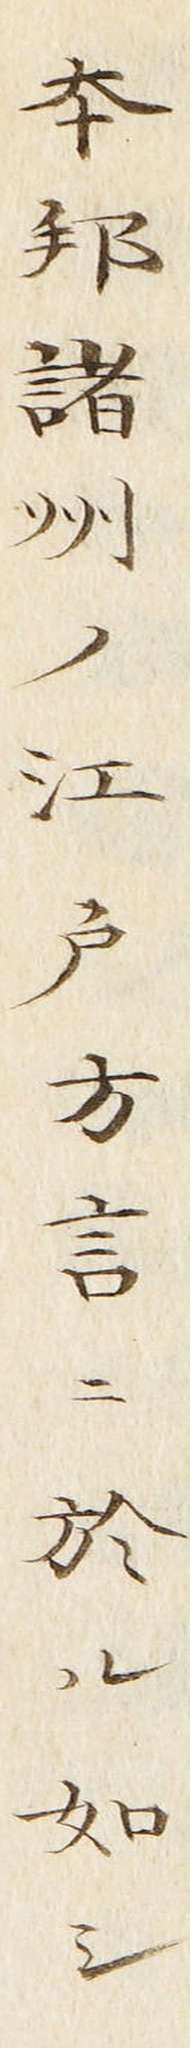本邦諸州ノ江戸方言ニ於ル如シ
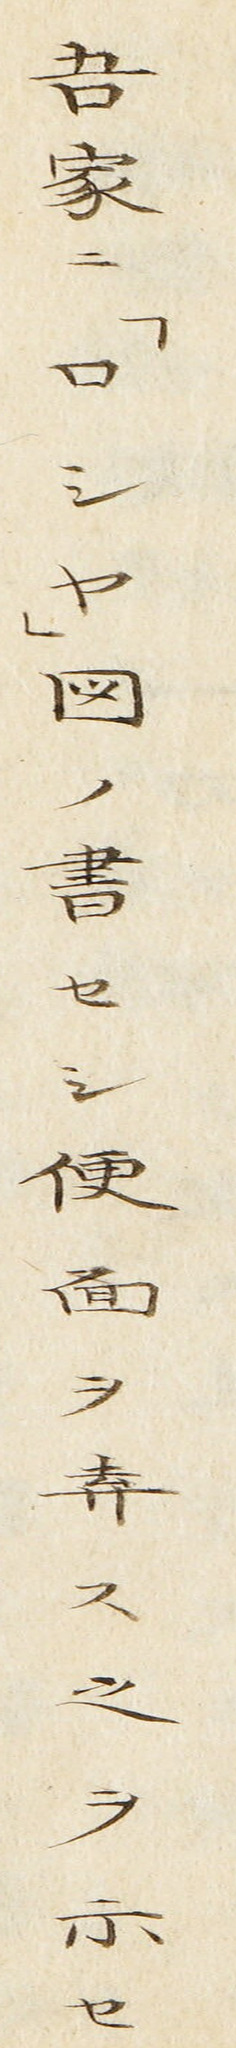〇吾家ニ「ロシヤ」図ノ書セシ便面ヲ弆ス之ヲ示セ
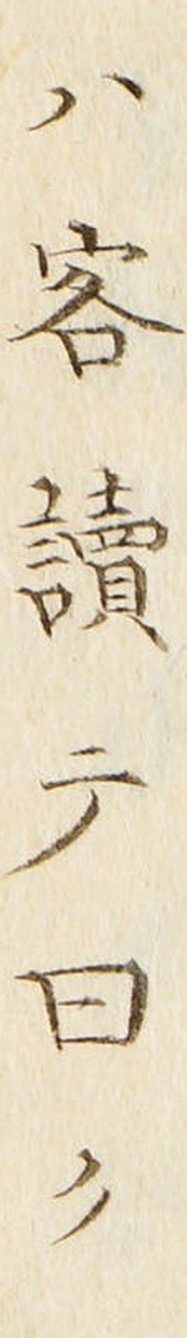ハ客讀テ曰ク
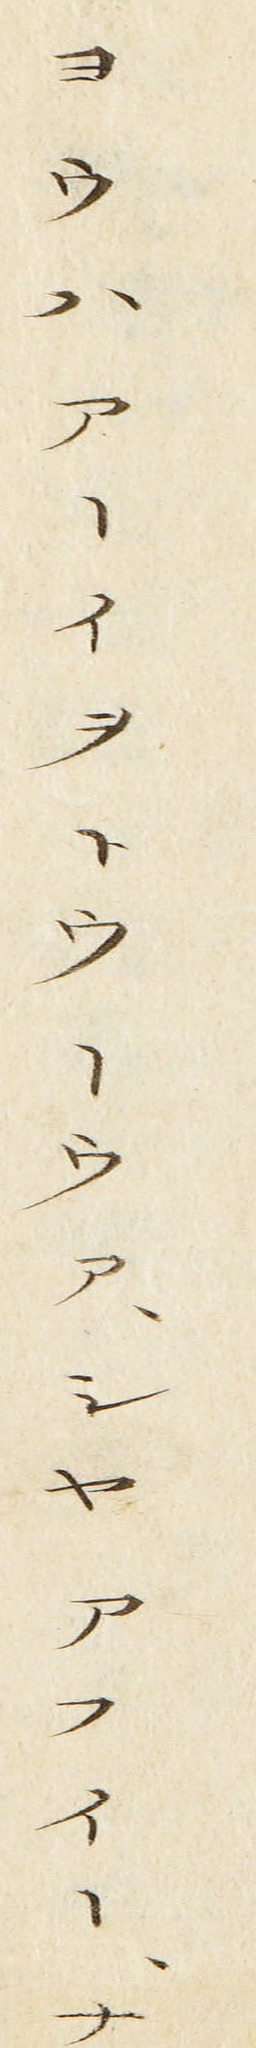ヨウハアーイヲトウーウア、シヤアフイー、ナ
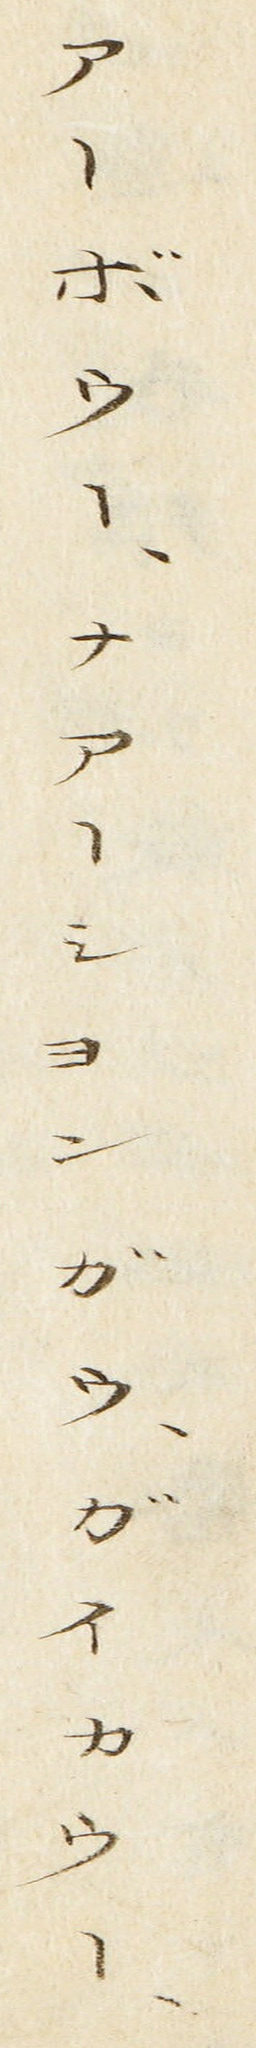アーボウー、ナアーシヨンガウ、ガイカウー、
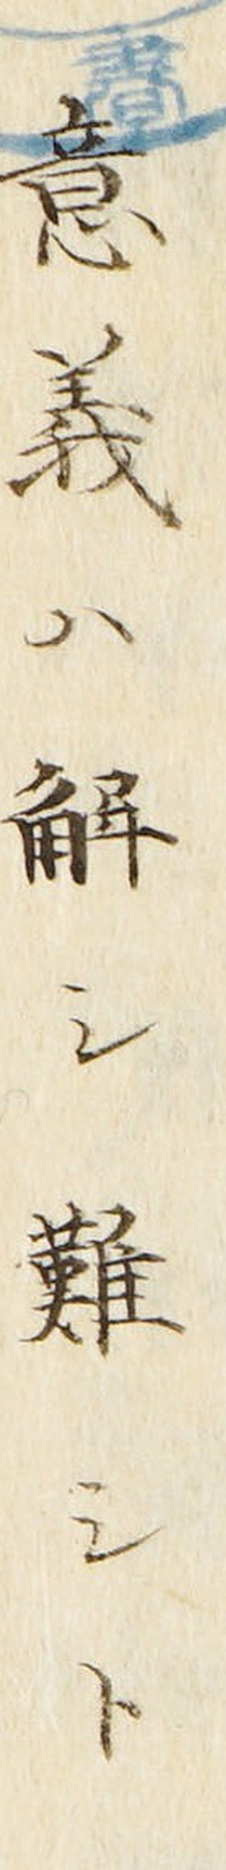意義ハ解シ難シト
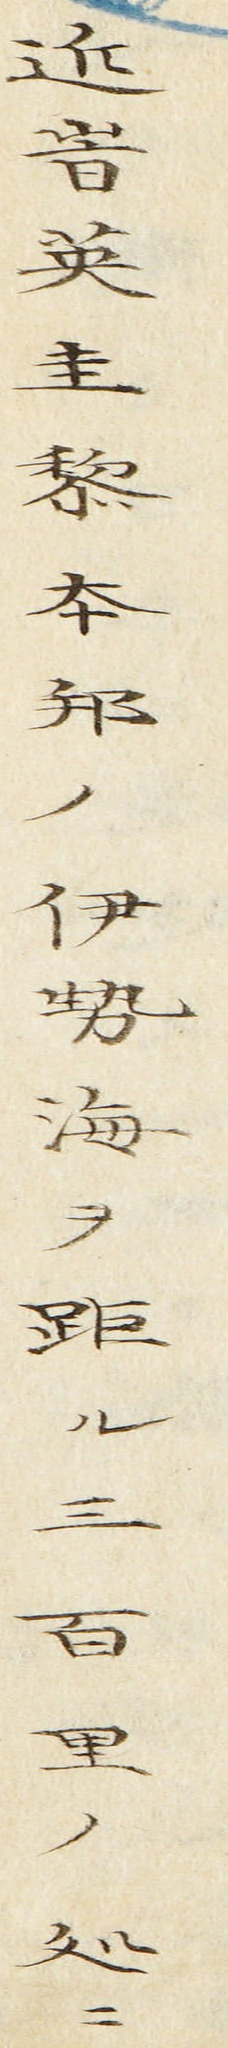〇近旹英圭黎本邦ノ伊勢海ヲ距ル三百里ノ処ニ
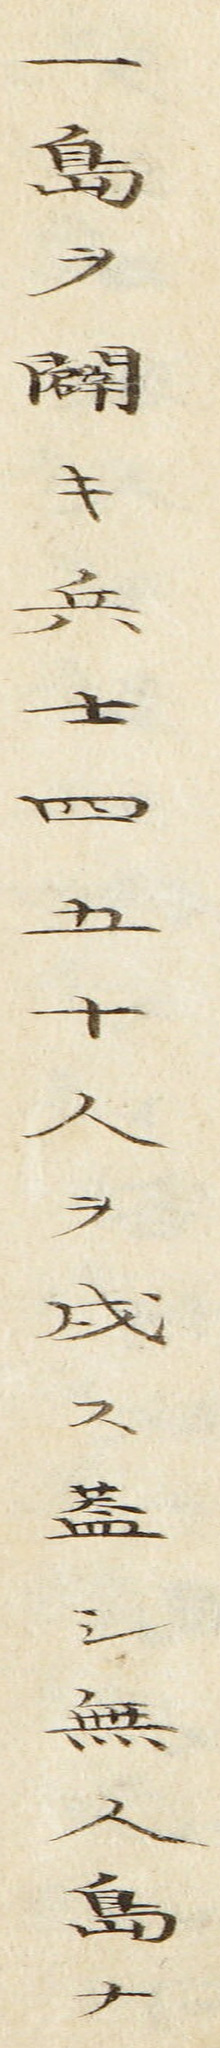一島ヲ闢キ兵士四五十人ヲ戍ス蓋シ無人島ナ

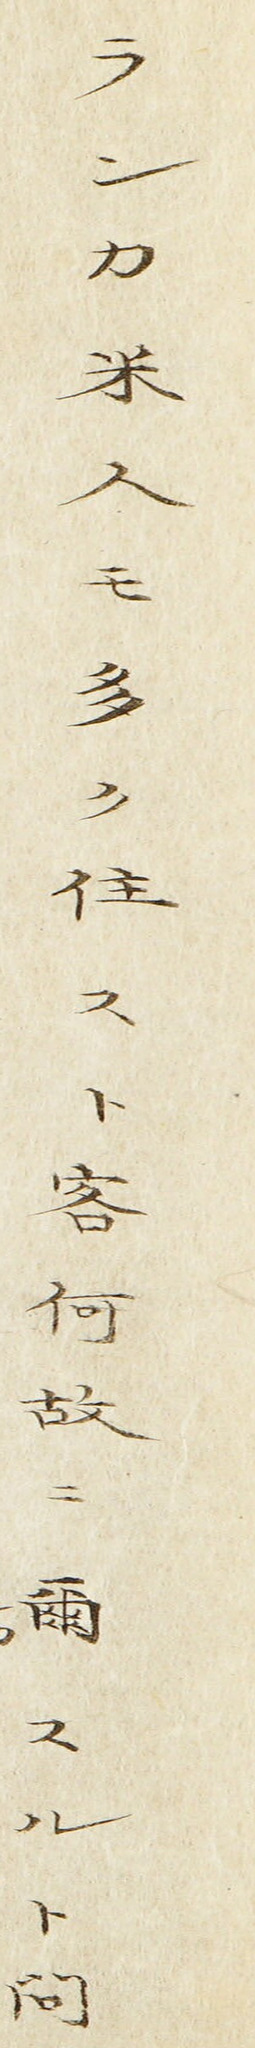ランカ米人モ多ク住スト客何故ニ爾スルト問
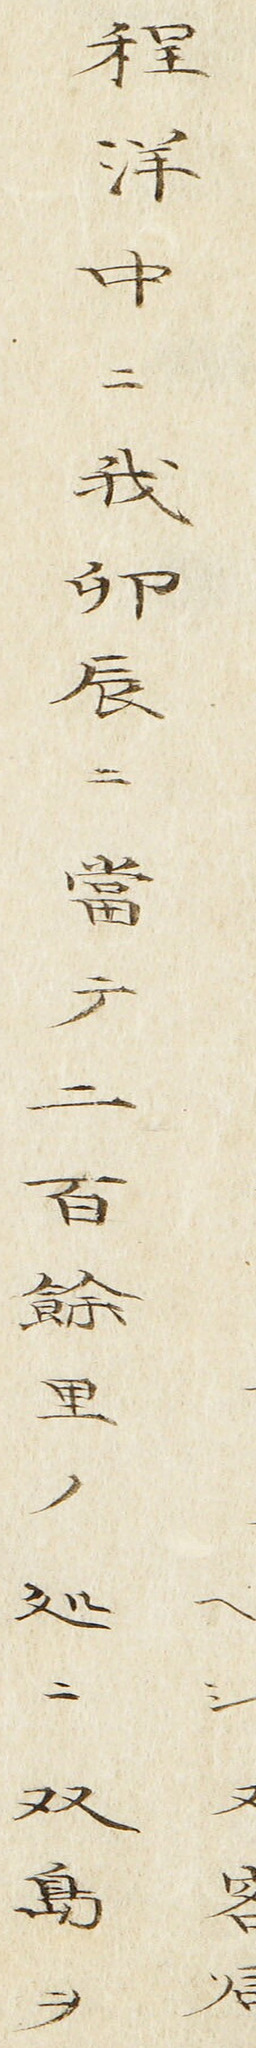程洋中ニ我卯辰ニ當テ二百餘里ノ処ニ双島ヲ
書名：蕃談
